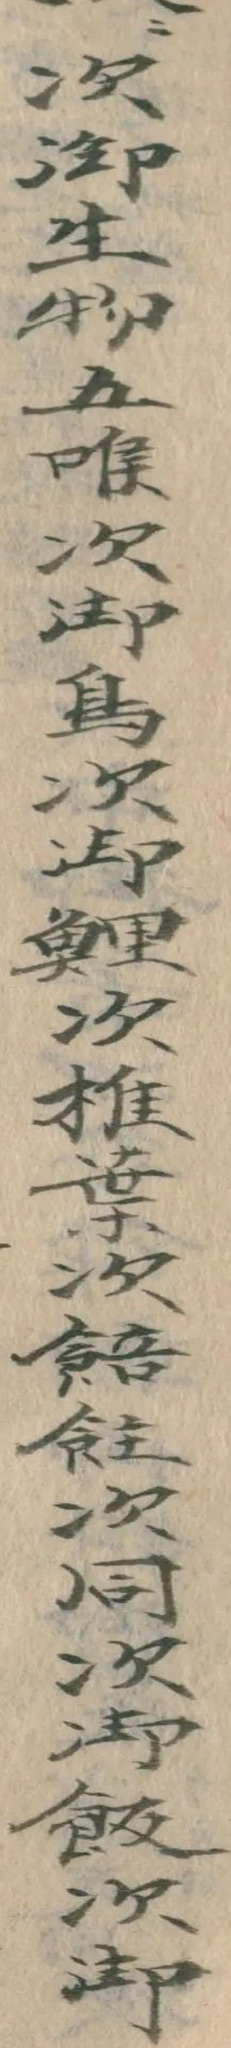積御料次御生物五喉次御鳥◦御鯉次椎葉次餢飳次同◦御飯次御糝
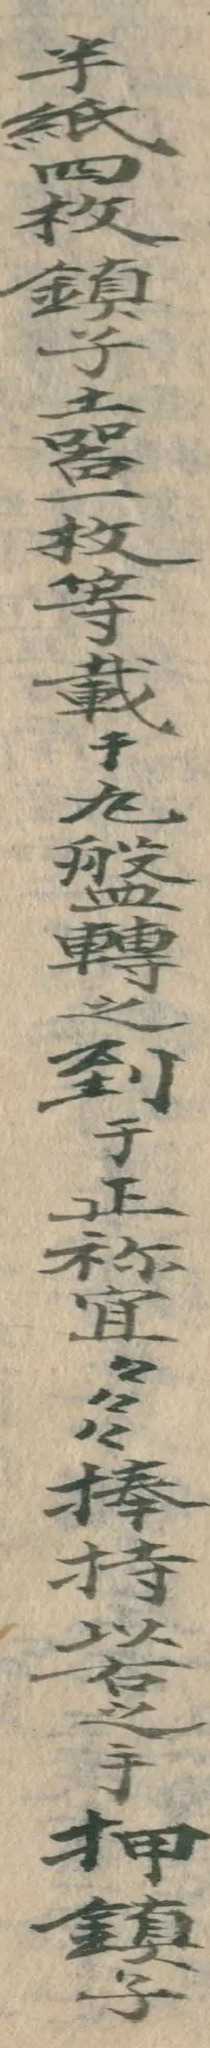半紙四枚鎮子土器一枚等載于丸盤転之到于正祢宜々々々捧持以右之手押鎮子
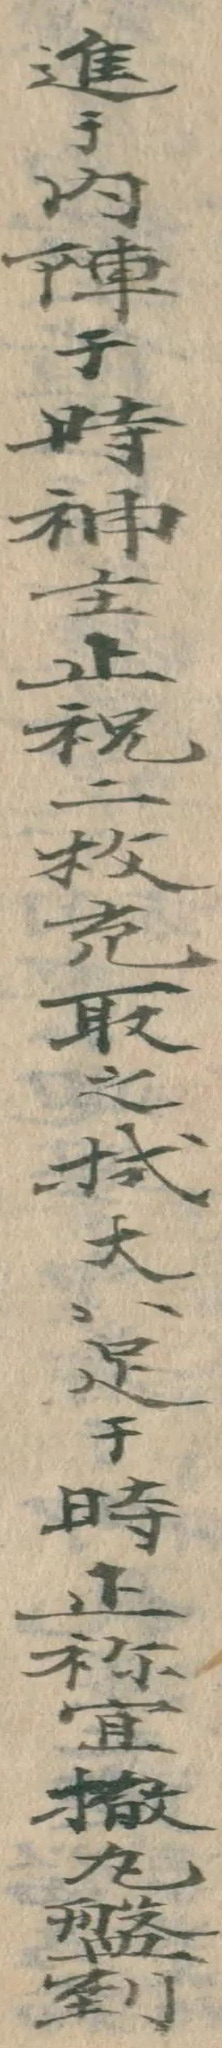進于内陣于時神主正祝二枚充取之拭大八足于時正祢宜撤丸盤到
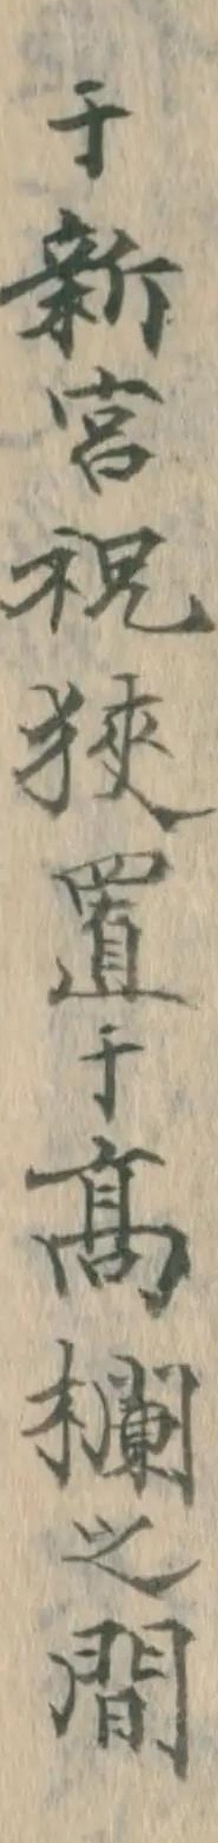于新宮祝狭置于高欄之間

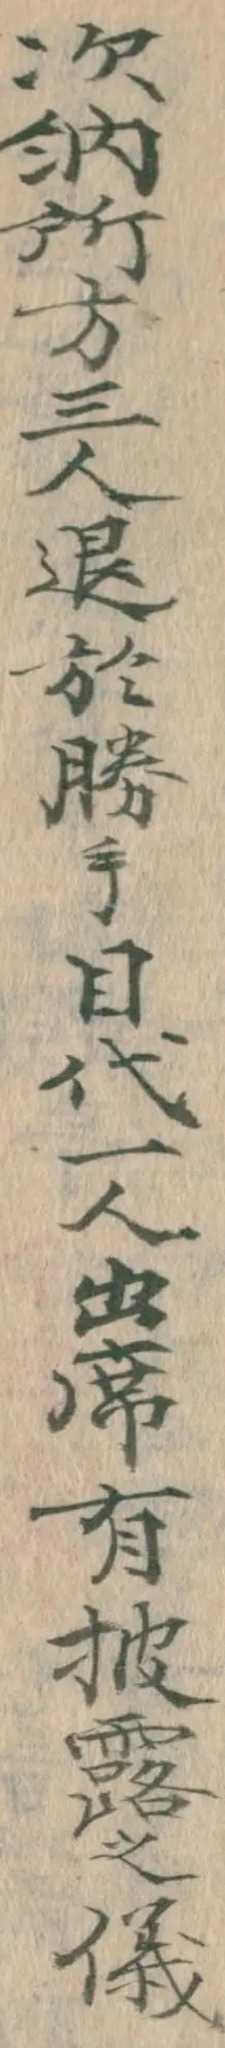次納所方三人退於勝手目代一人出席有披露之儀
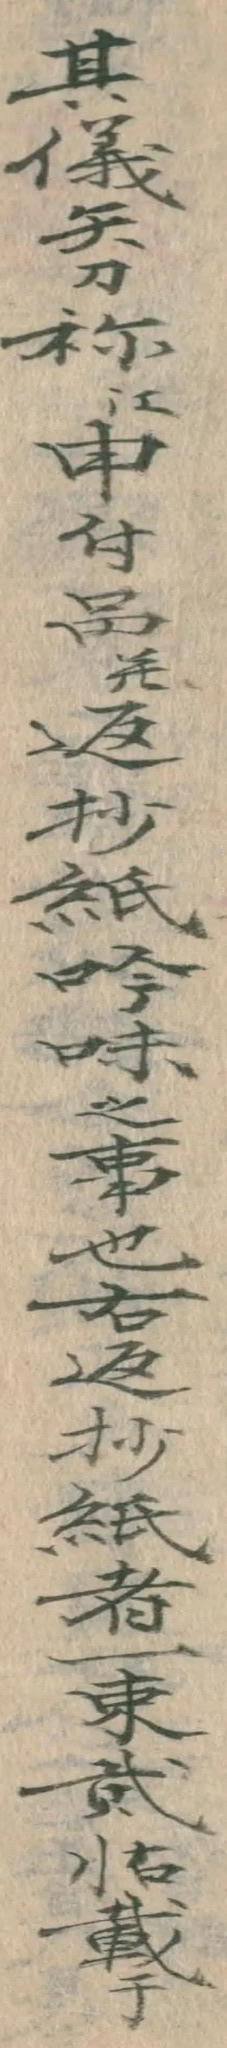其儀矢刀称江申付品并返抄紙吟味之事也右返抄紙者一束弐帖載于
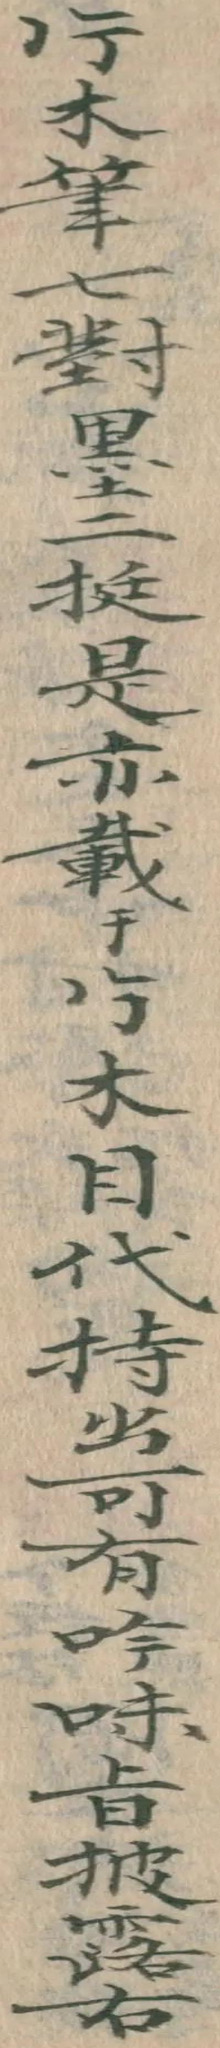片木筆七対墨二挺是亦載于片木目代持出可有吟味旨披露右
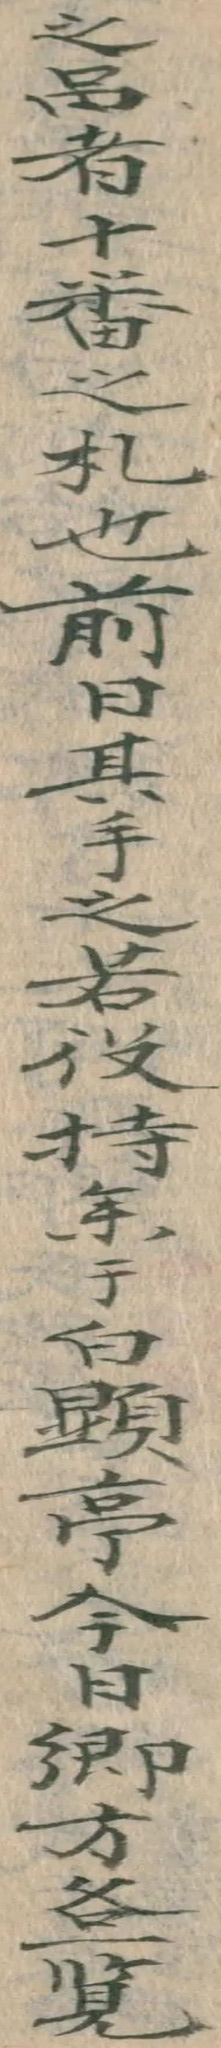之品者十番之札也前日其手之若役持参于白顕亭今日郷方各一覧
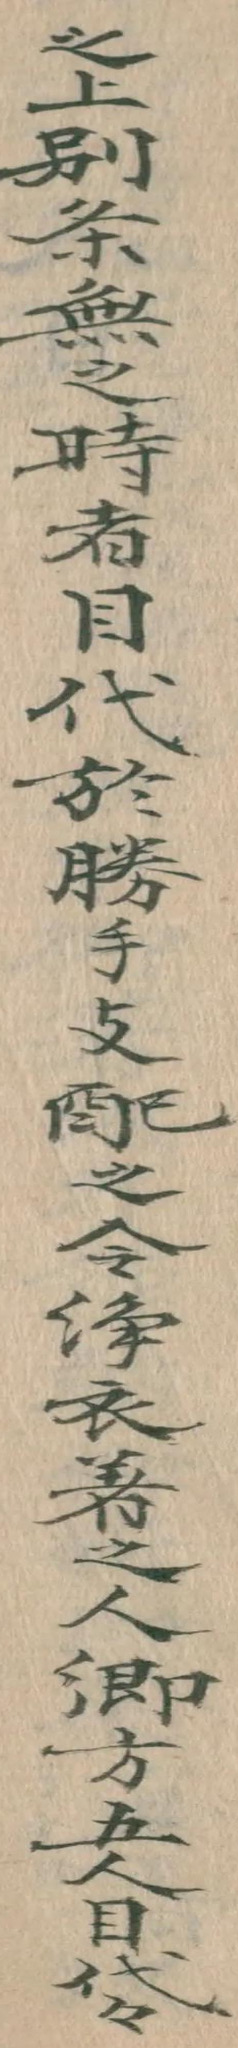之上別条無之時者目代於勝手支配之令浄衣着之人郷方五人目代々
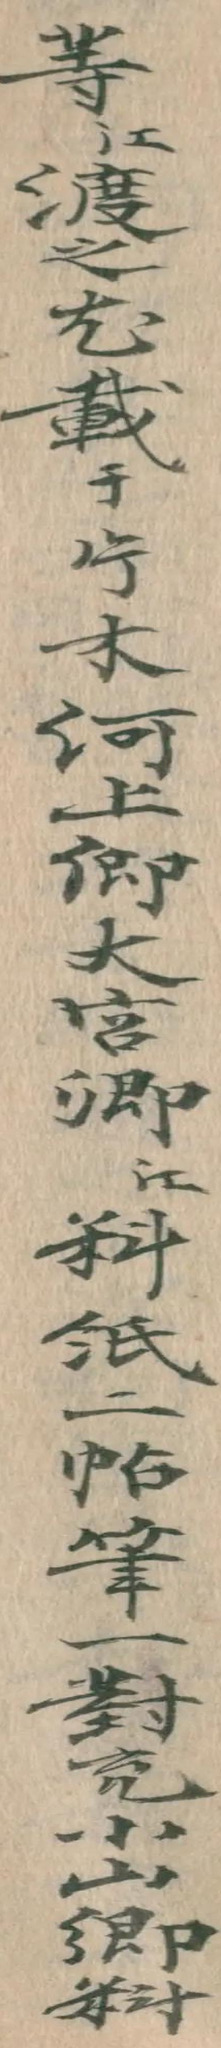等江渡之尤載于片木河上郷大宮郷江料紙二帖筆一対充小山郷料
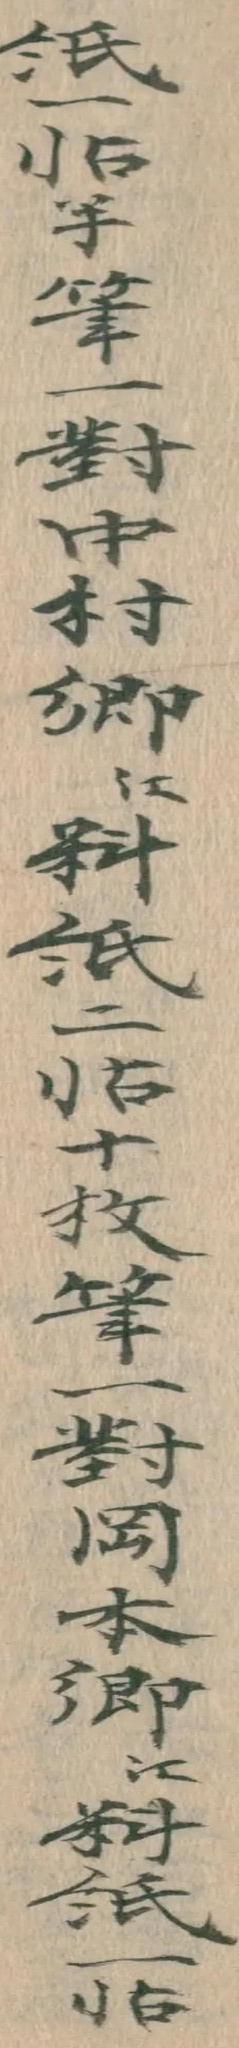紙一帖半筆一対中村郷江料紙二帖十枚筆一対岡本郷江料紙一帖
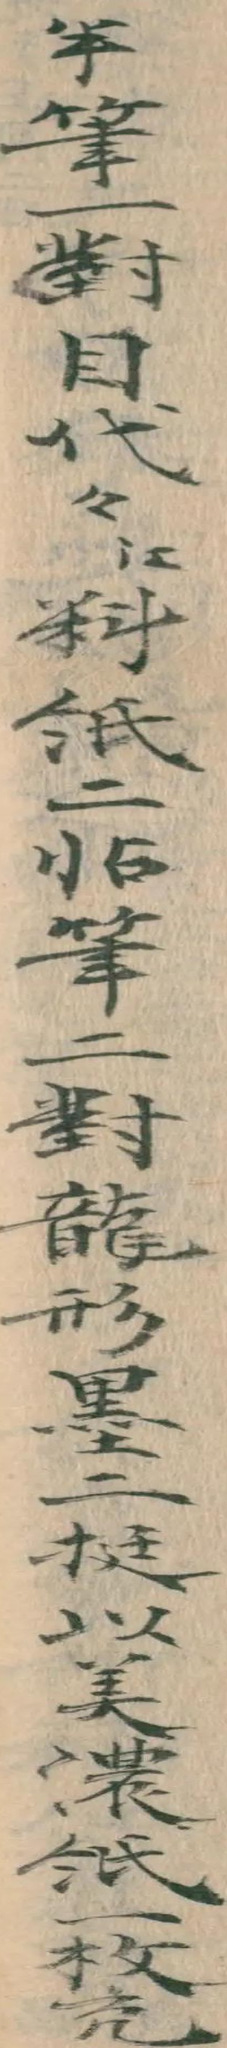半筆一対目代々江料紙二帖筆二対龍形墨二挺以美濃紙一枚充
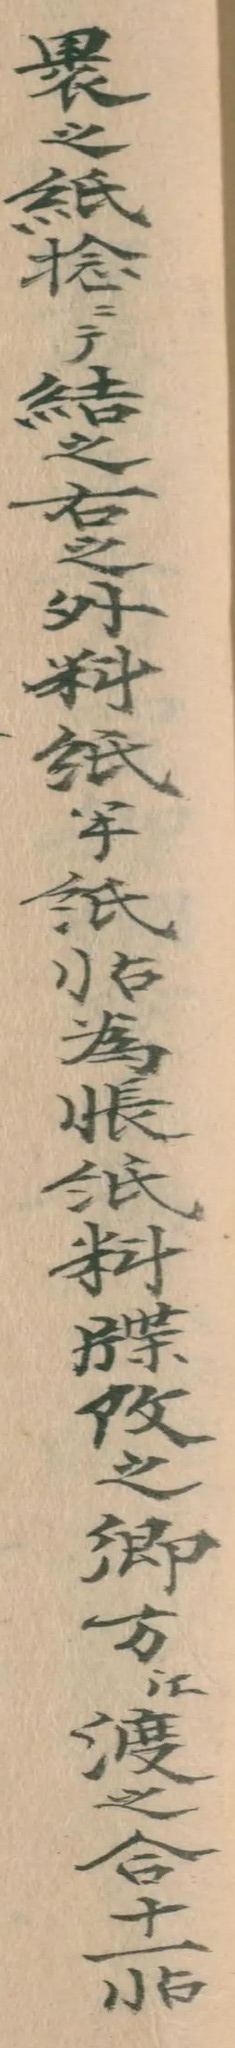裹之紙捻ニテ結之右之外料紙半紙帖為帳紙料牒改之郷方江渡之合十一帖
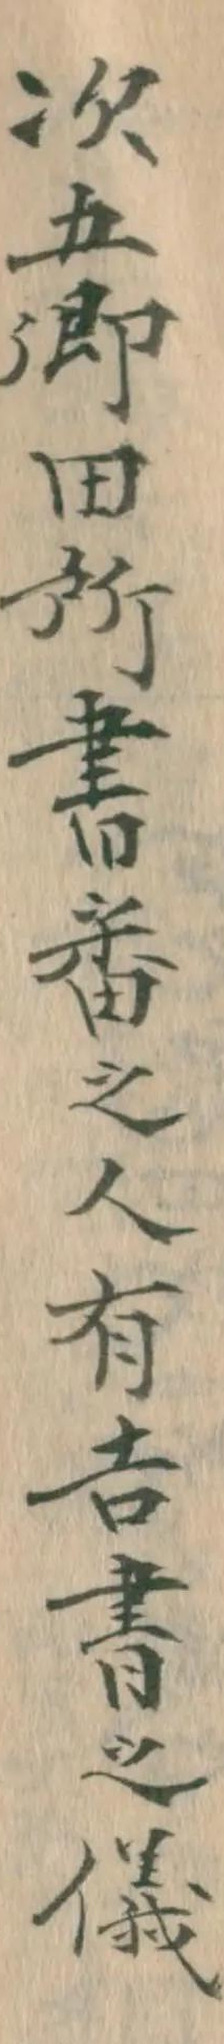次五郷田所書番之人有吉書之儀
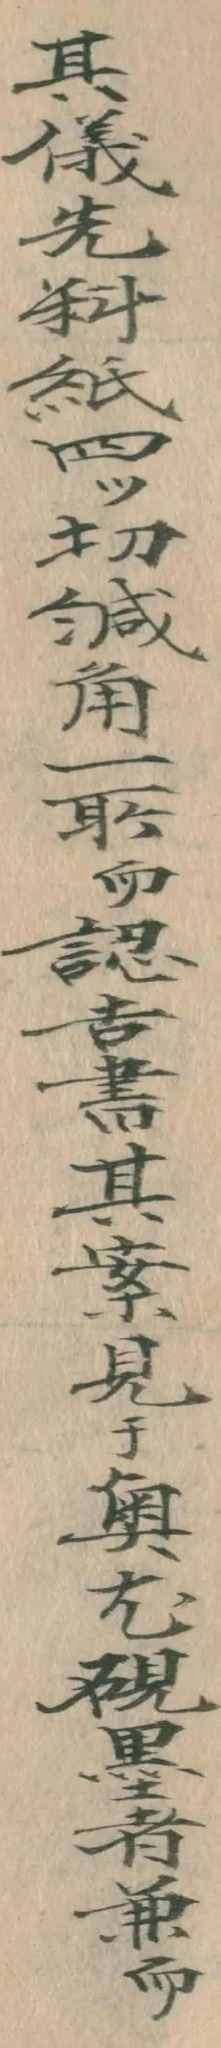其儀先料紙四ツ切鍼角一所而認吉書其案見于奥尤硯墨者兼而
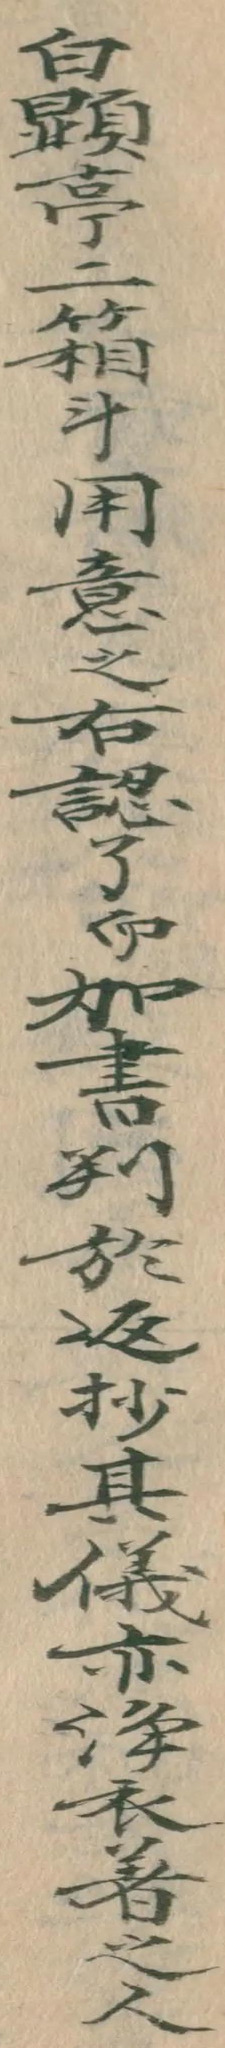白顕亭二箱計用意之右認了而加書判於返抄其儀亦浄衣着之人
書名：賀茂社記録. 第9冊
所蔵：国立国会図書館 National Diet Library, JAPAN
